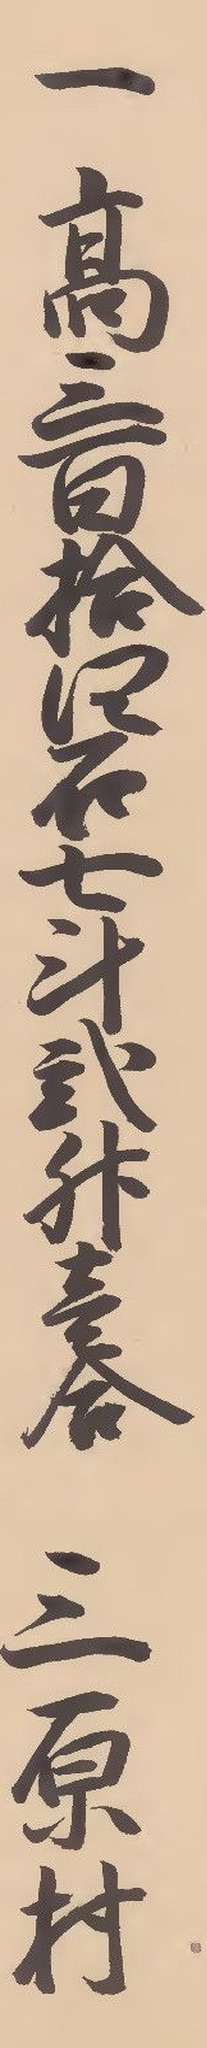一髙三百拾四石七斗弐升壱合三原村
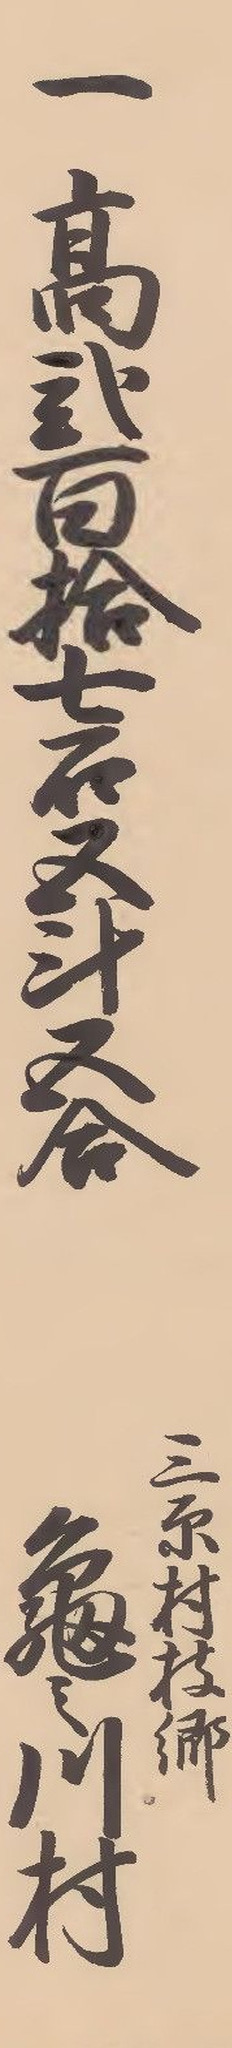一髙弐百拾七石五斗五合龜之川村
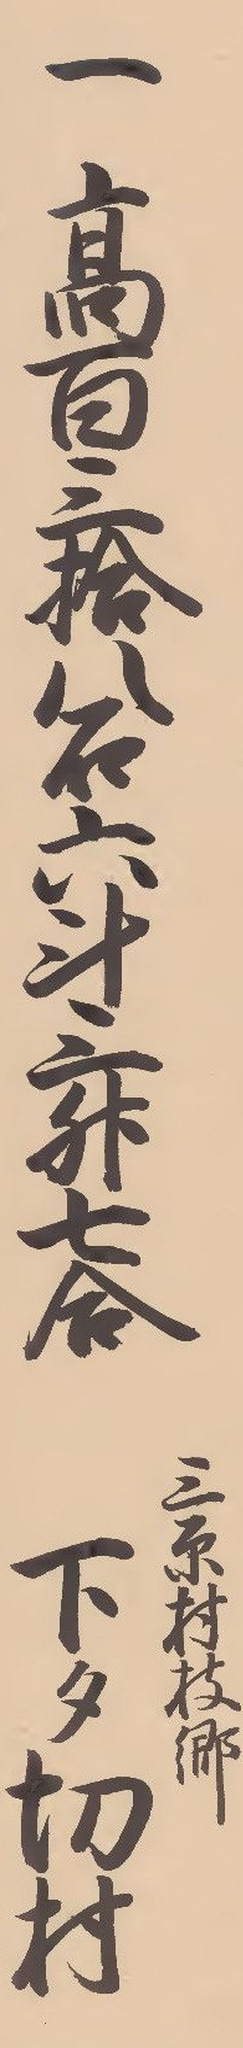一髙百三拾八石六斗三升七合下タ切村
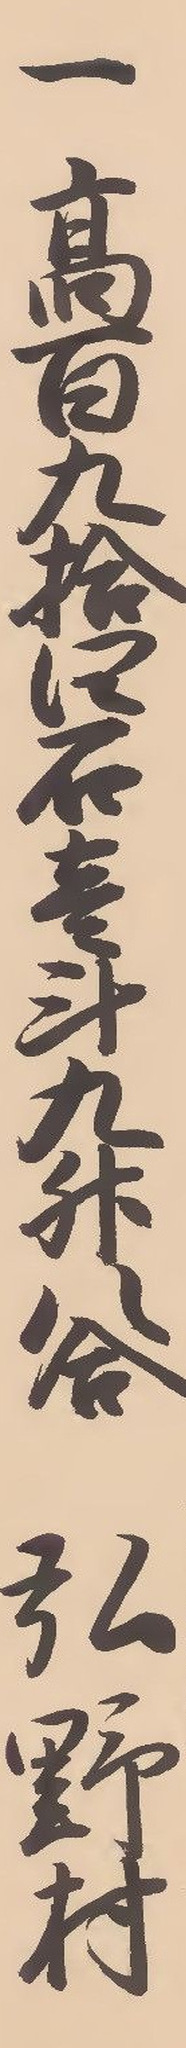一髙百九拾四石壱斗九升八合弘野村
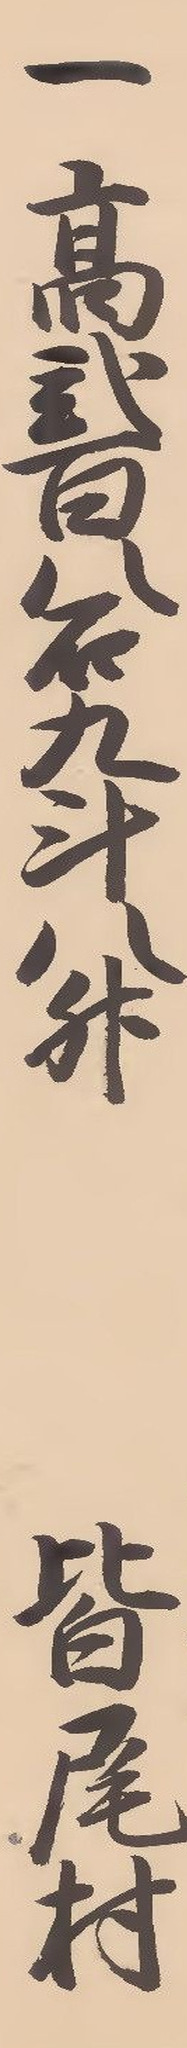一髙弐百八石九斗八升皆尾村
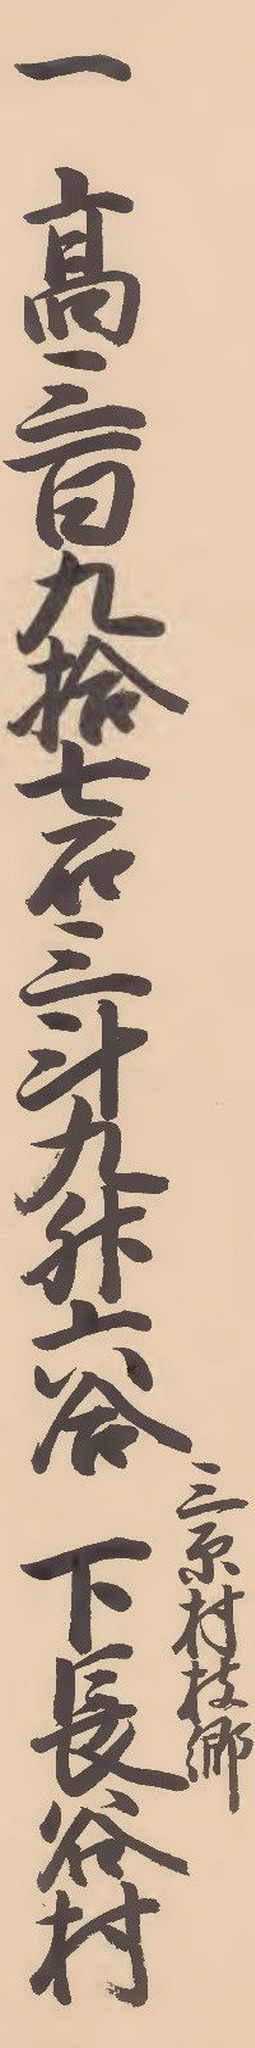一髙三百九拾七石三斗九升六合下長谷村
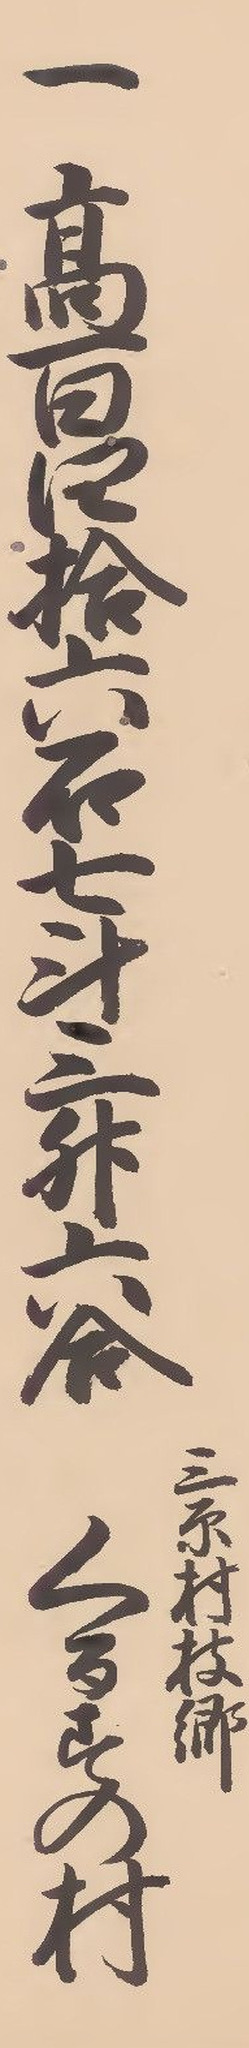一髙百四拾六石七斗三升六合くるすの村

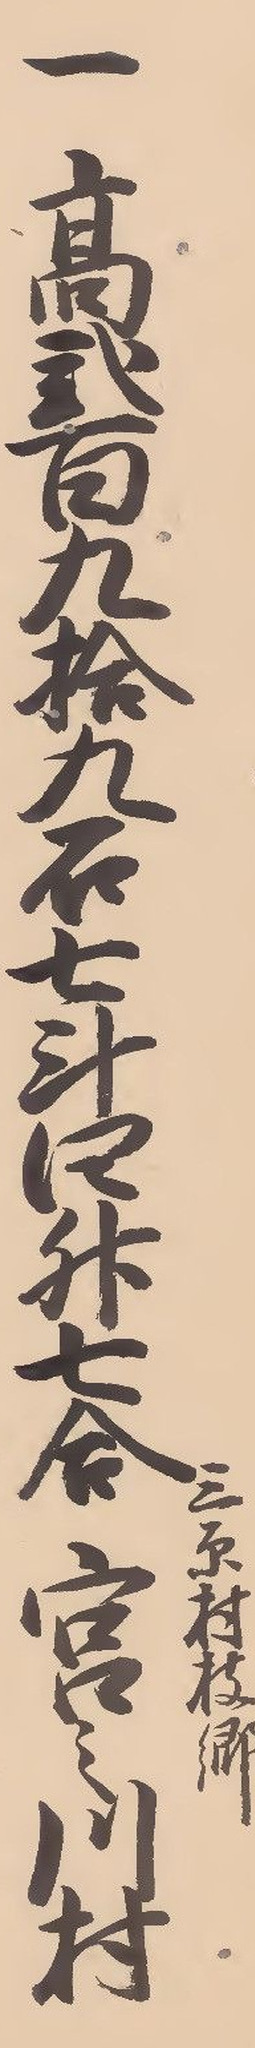一高弐百九拾九石七斗四升七合宮之川村
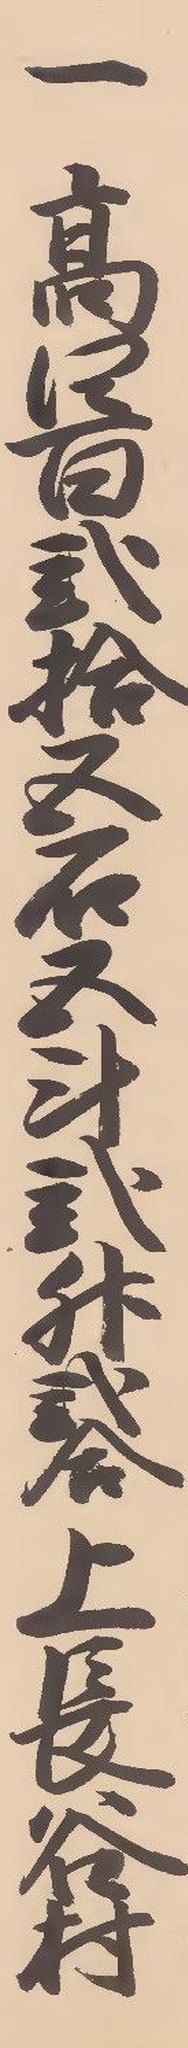一高四百弐拾五石五斗弐升弐合上長谷村
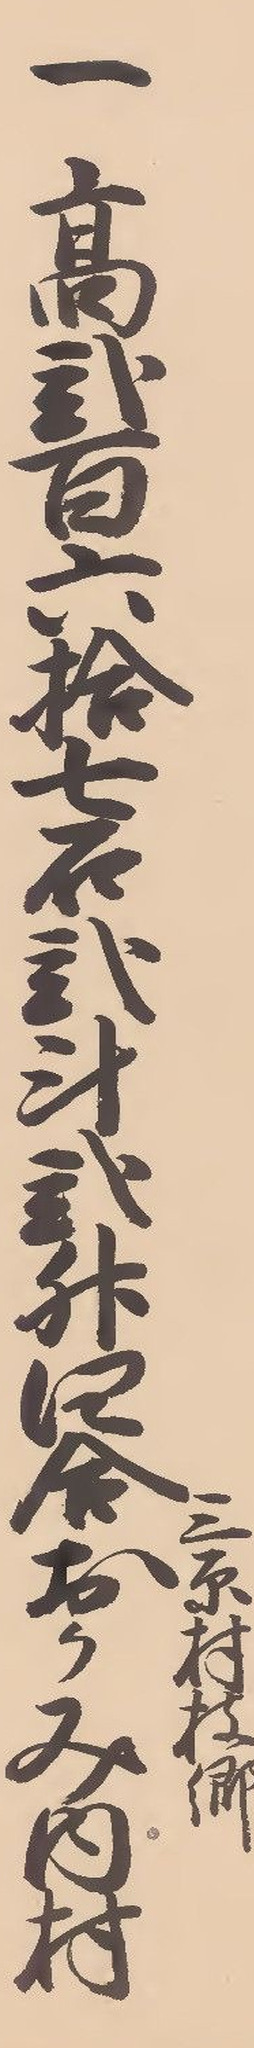一高弐百六拾七石弐斗弐升四合おかみ内村
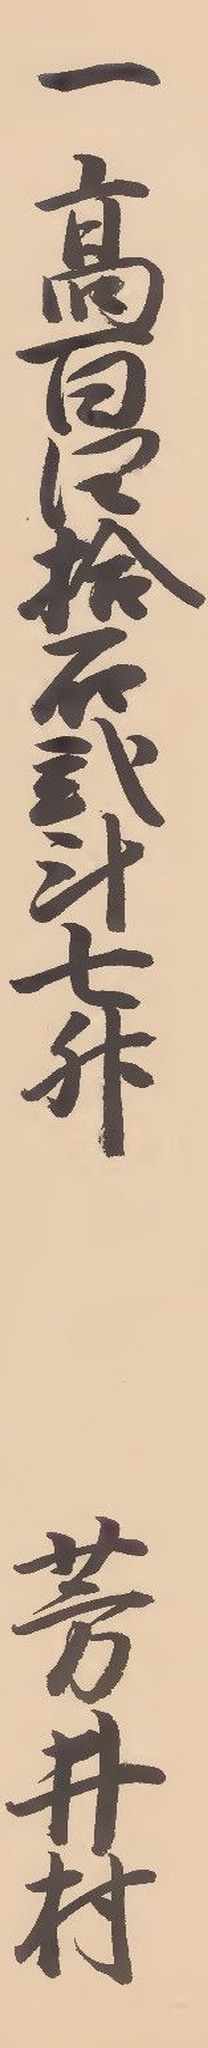一高百四拾石弐斗七升芳井村
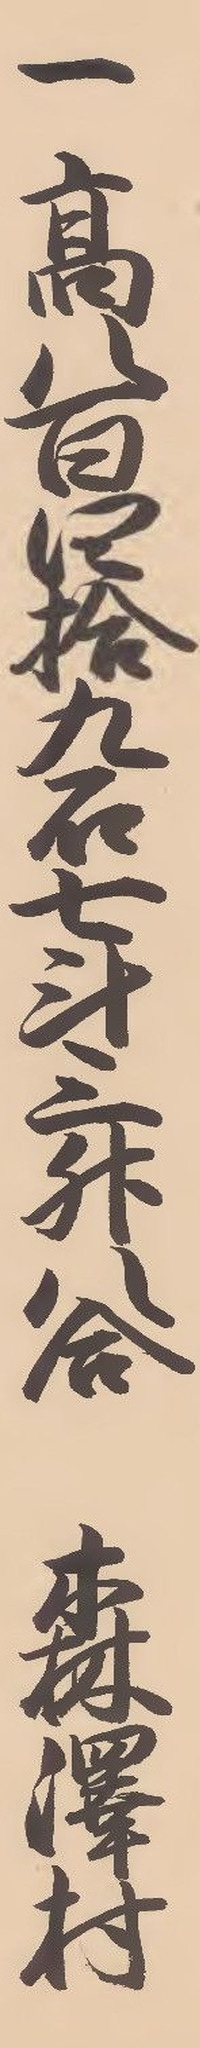一高八百四拾九石七斗三升八合森澤村
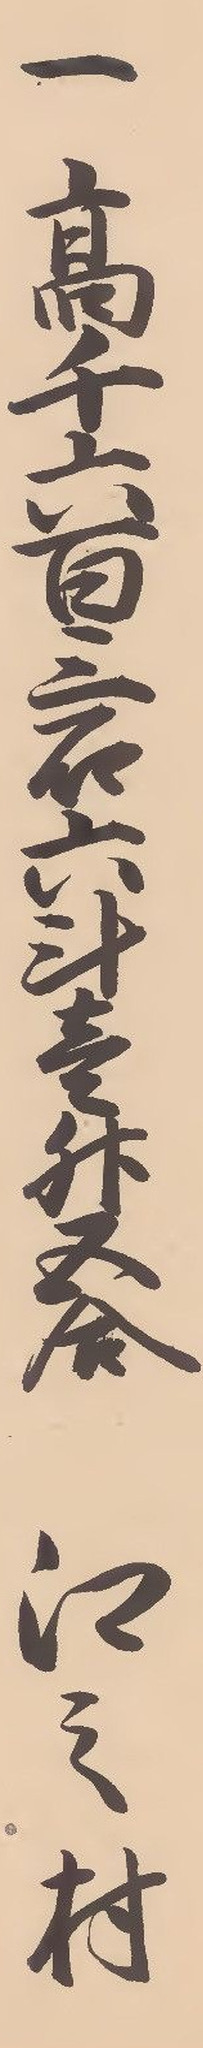一高千六百三石六斗壱升五合江之村
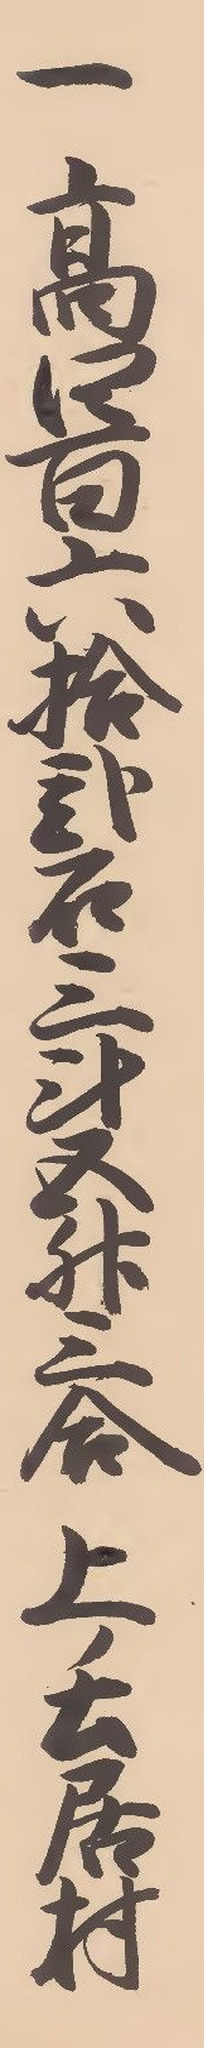一高四百六拾弐石三斗五升三合上ノ土居村
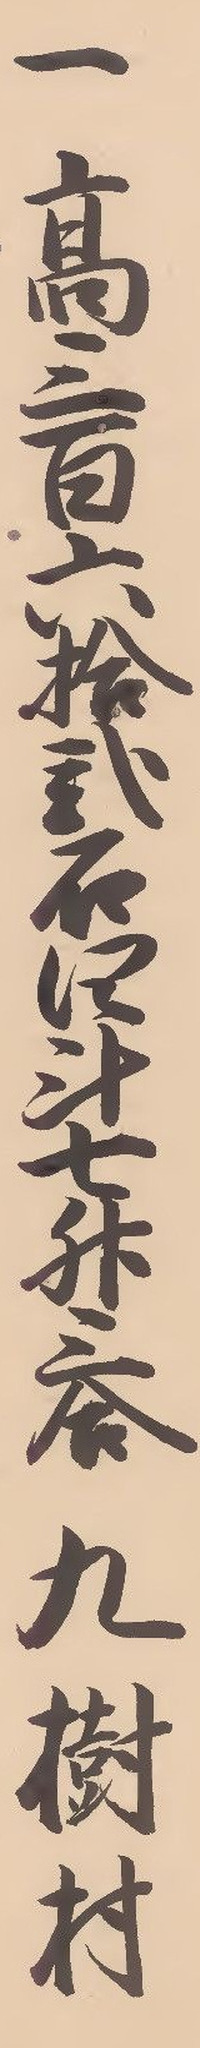一高三百六拾弐石四斗七升三合九樹村

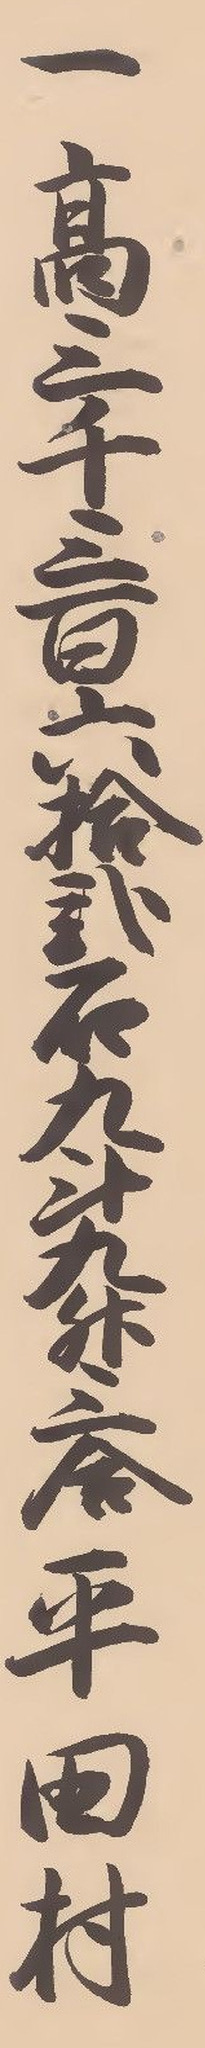一高三千三百六拾弐石九斗九升三合平田村
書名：土佐国郷帳
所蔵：国立公文書館 National Archives of Japan
